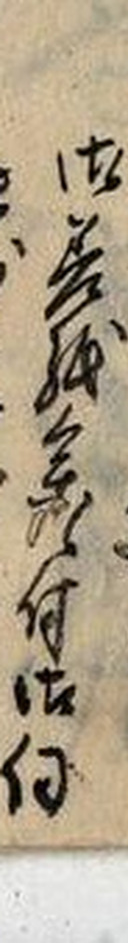御差越候付御伺
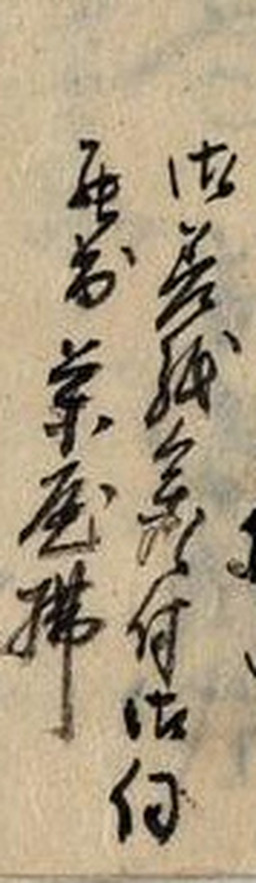罷出茶屋払
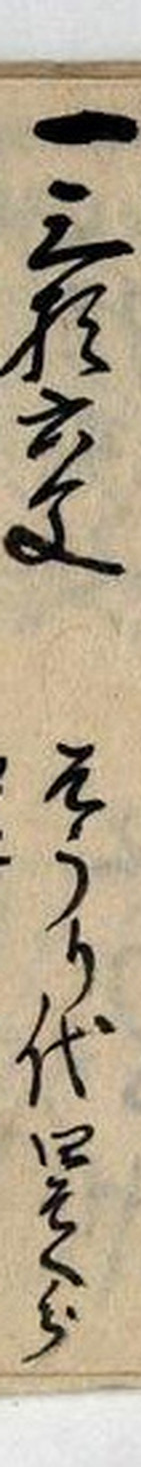一三拾六文そうり代四そく分
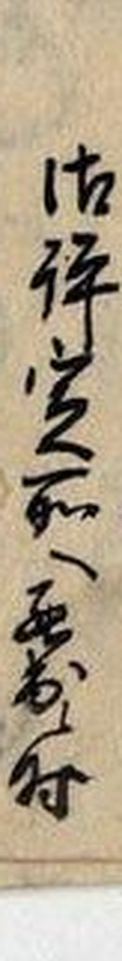御評定所へ罷出候付
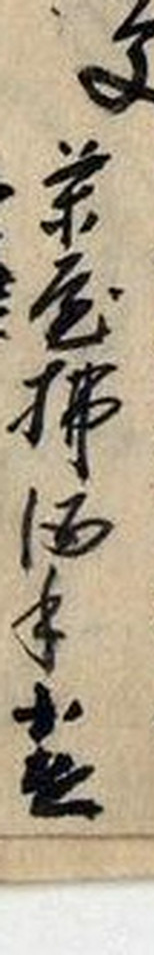茶屋払酒手小遣

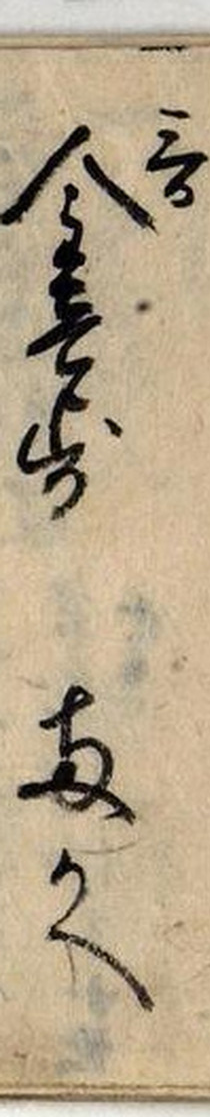金壱歩両かへ
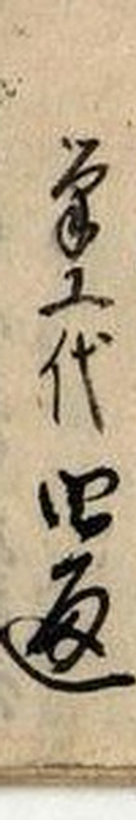筆工代四通
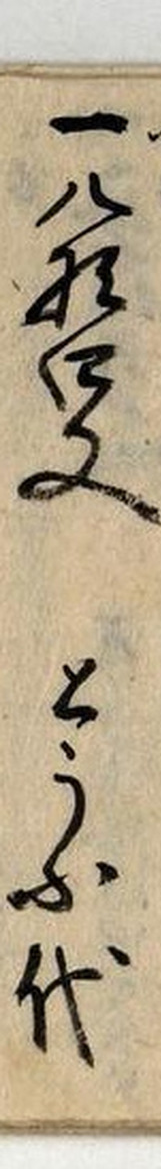一八拾四文とうふ代
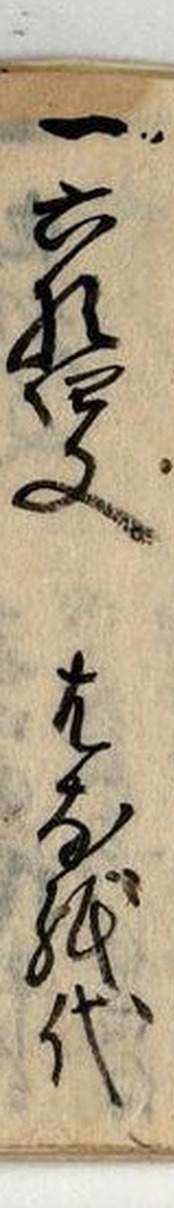一六拾四文はな紙代
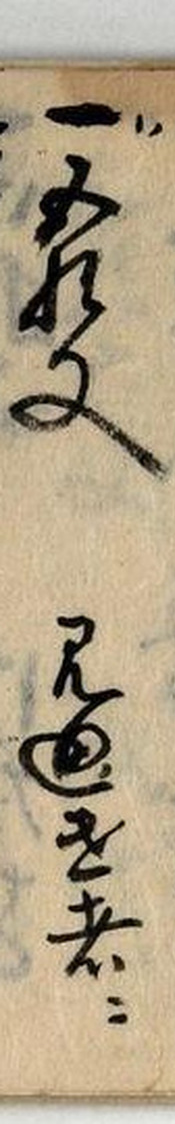一五拾文見廻遣者ニ
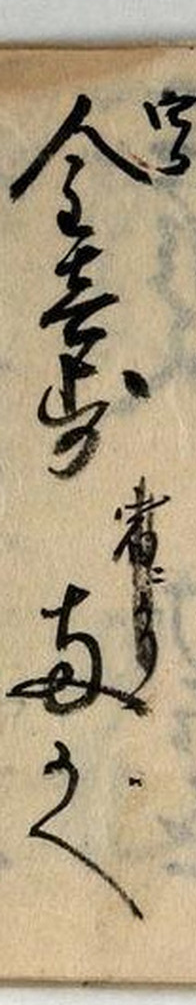金壱歩両かへ
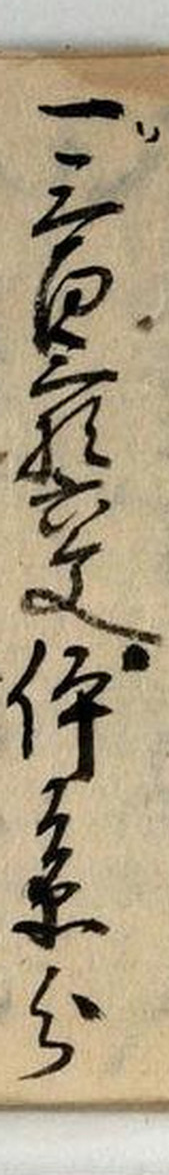一三百三拾六文伊兵衛分
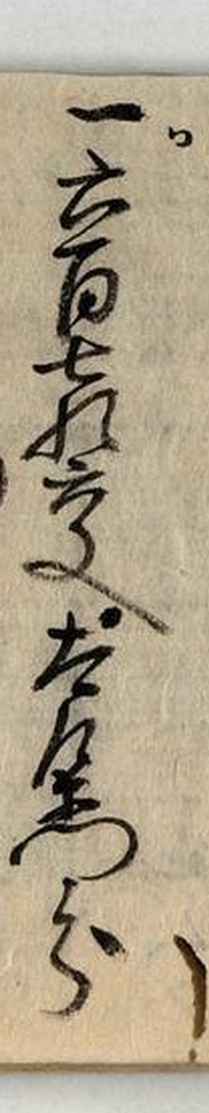一六百七拾六文太左衛門分

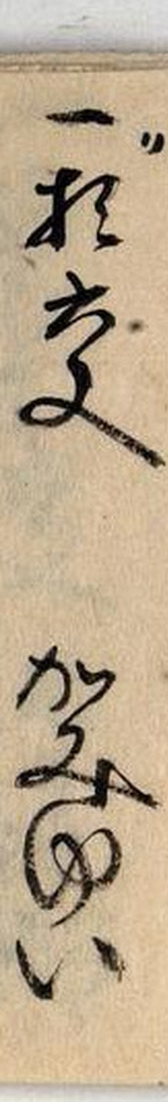一拾六文かみゆい
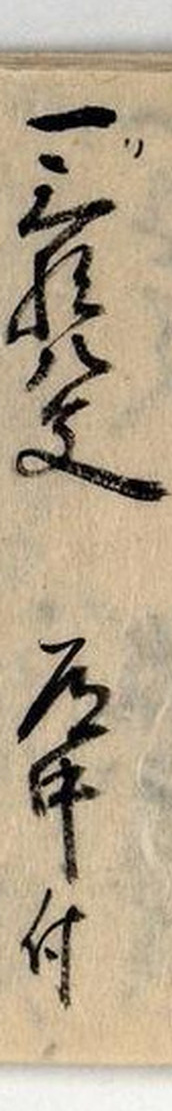一三拾八文道中付
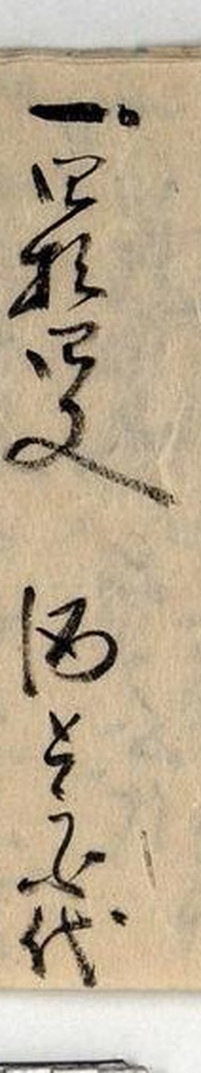一四拾四文酒とうふ代
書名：道中小遣留帳（旅）
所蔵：福井県文書館 Fukui Prefectural Archives
